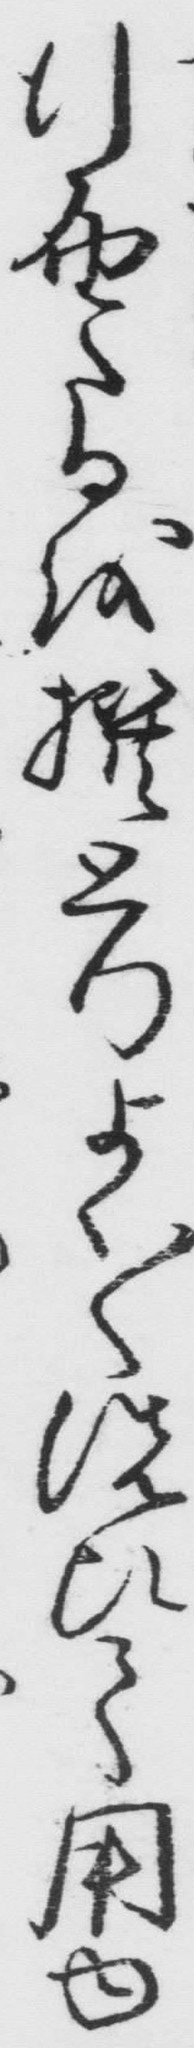引届たるを撰とりよく〳〵洗ひて用ゆ
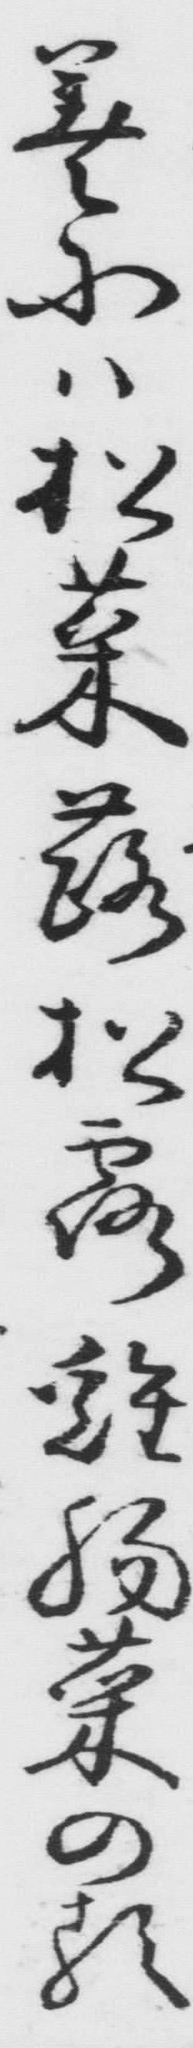羹には松菜蕗松露雞腸菜の類
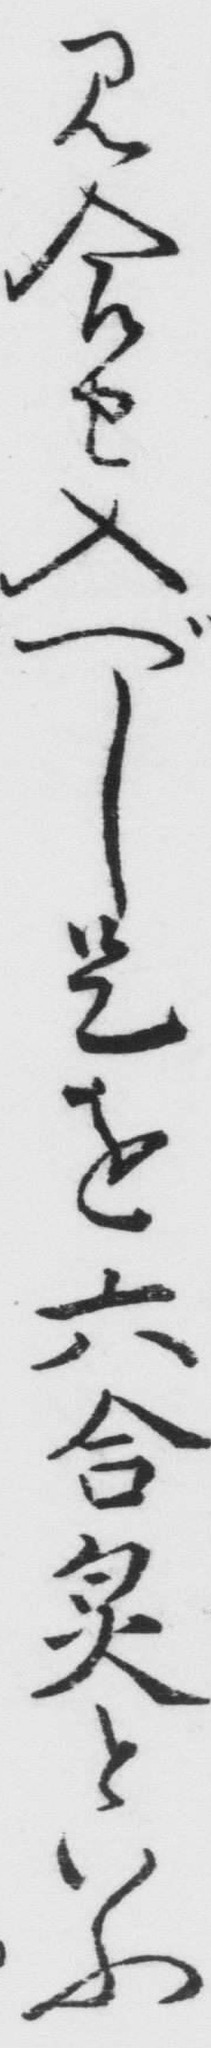見合せ入べし是を六合炙といふ
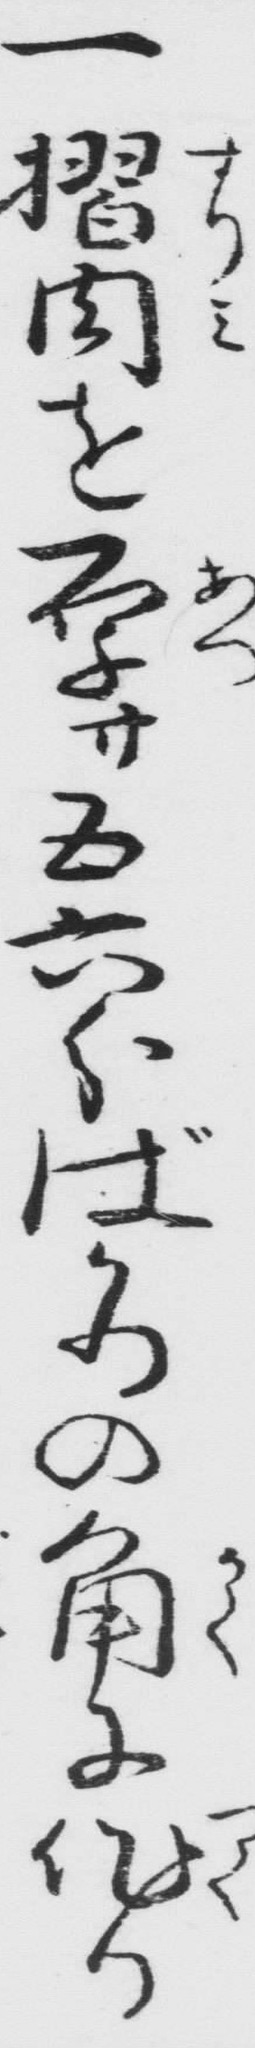一摺肉を厚さ五六分ばかりの角に作り
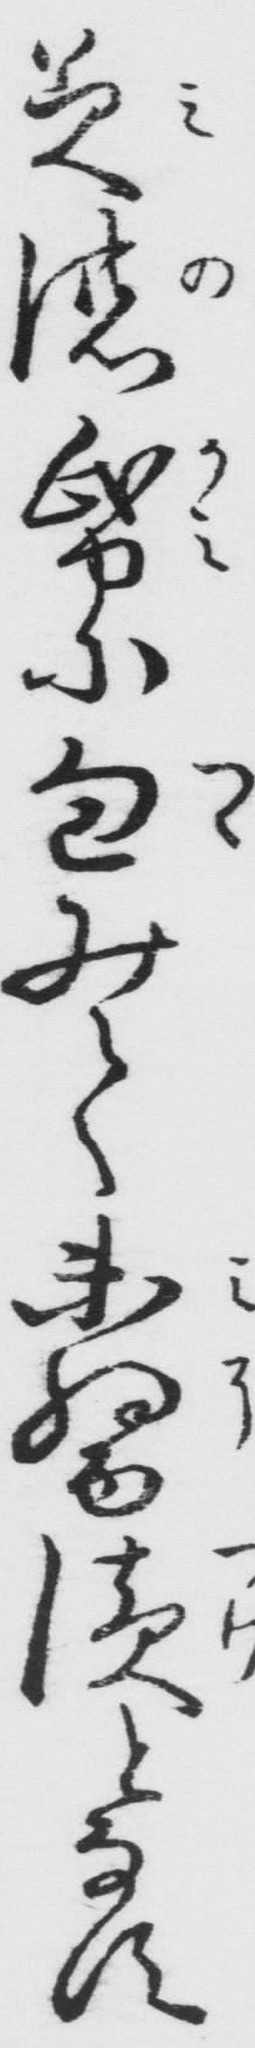美濃帋に包みて未醤漬となす
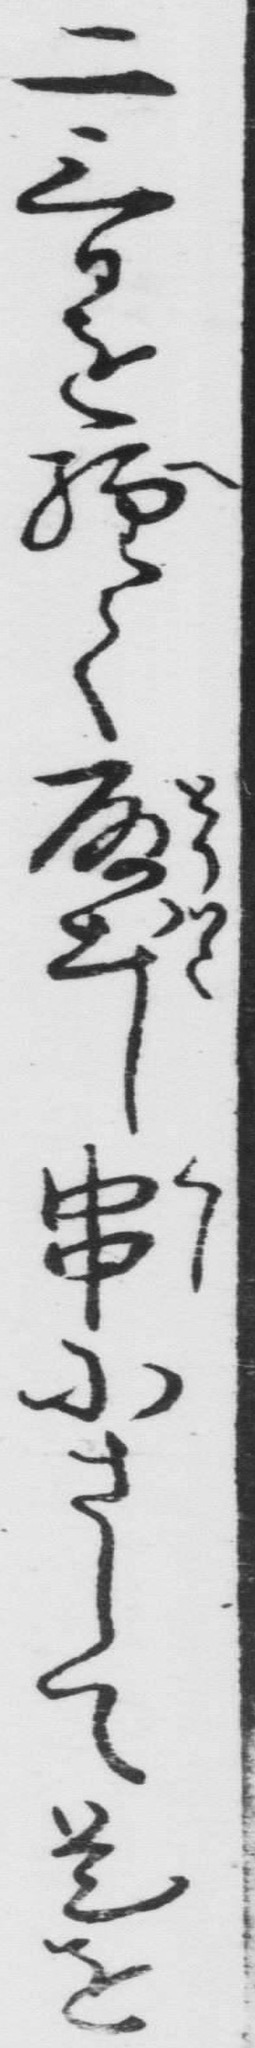二三日を経て取出し串にさして是を
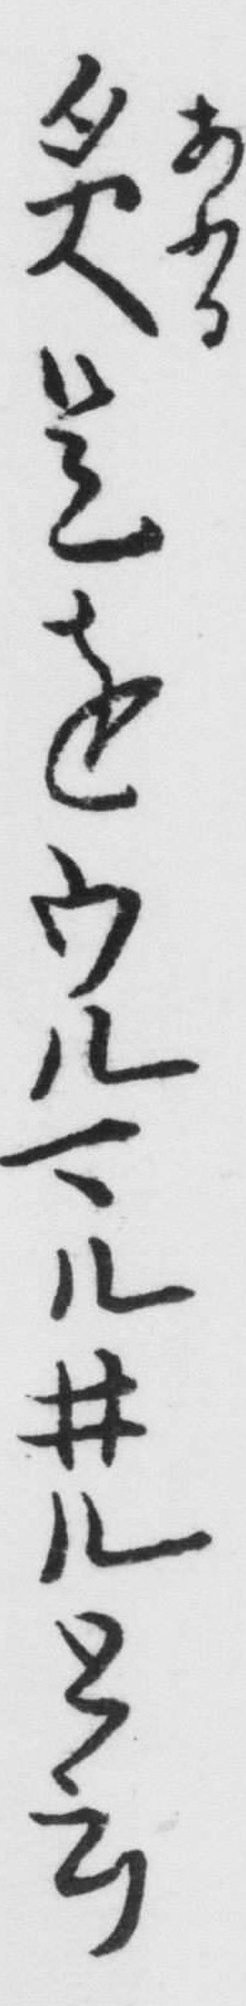炙是をウルマルヰルと云
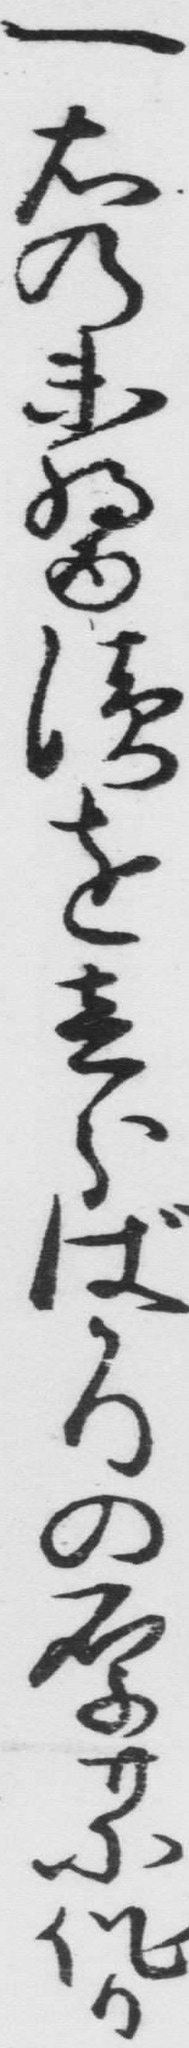一右の未醤漬を壱分ばかりの厚さに作り
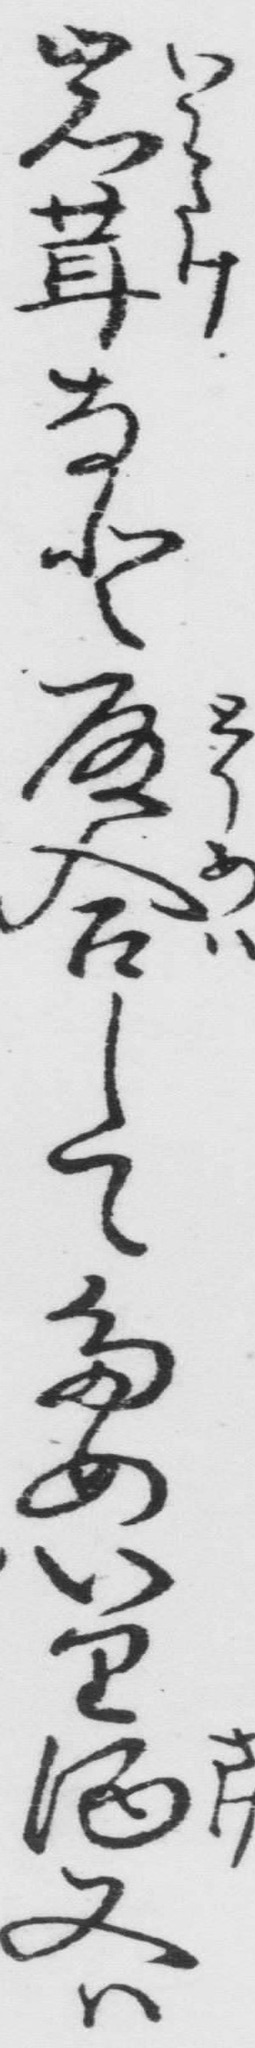岩茸なと取合してためいり酒又は
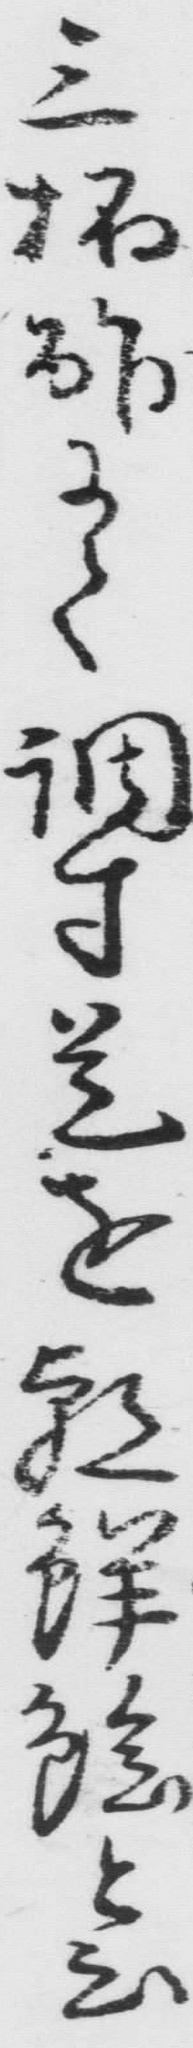三杯酢にて調す是を朝鮮鱠と云
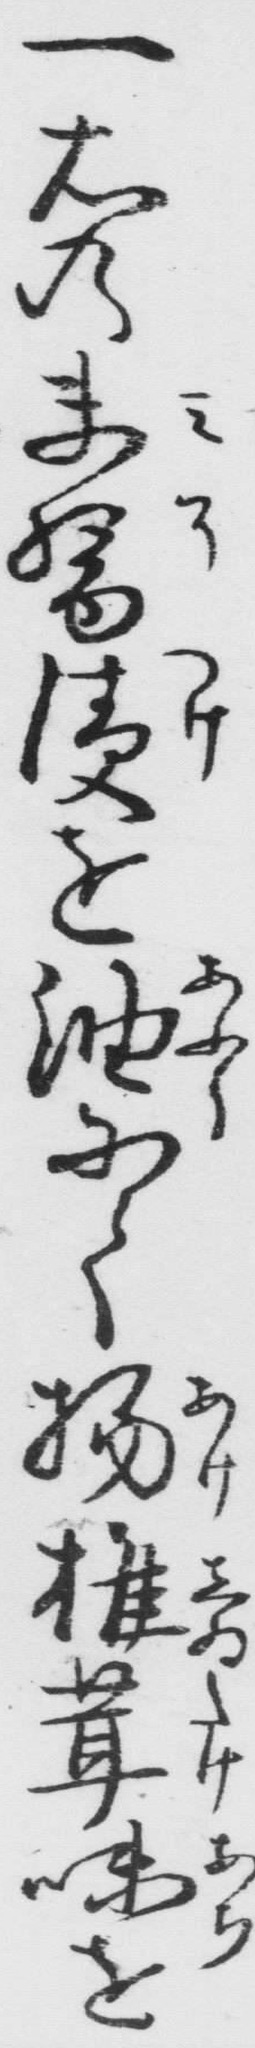一右の未醤漬を油にて揚椎茸味を
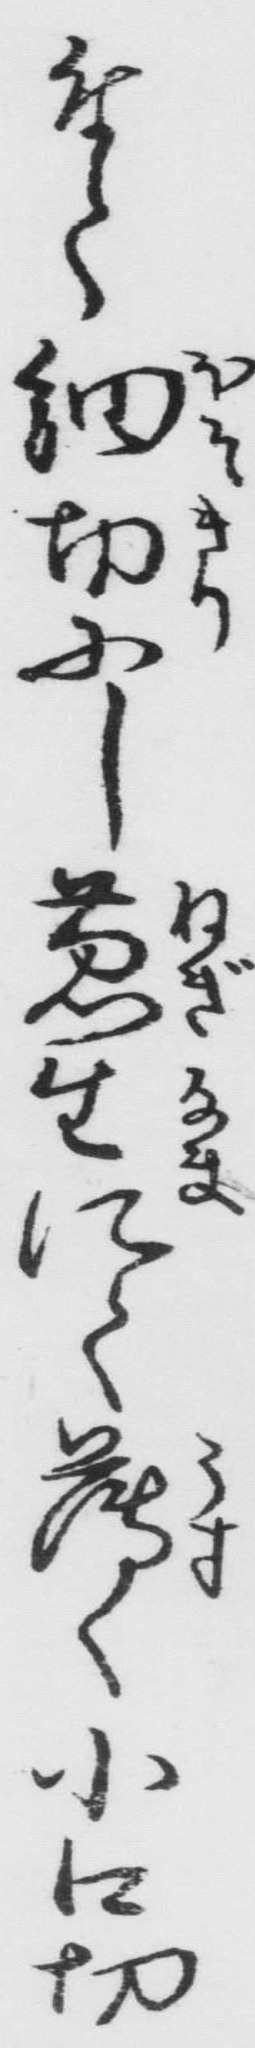付て細切にし葱生にて薄く小口切

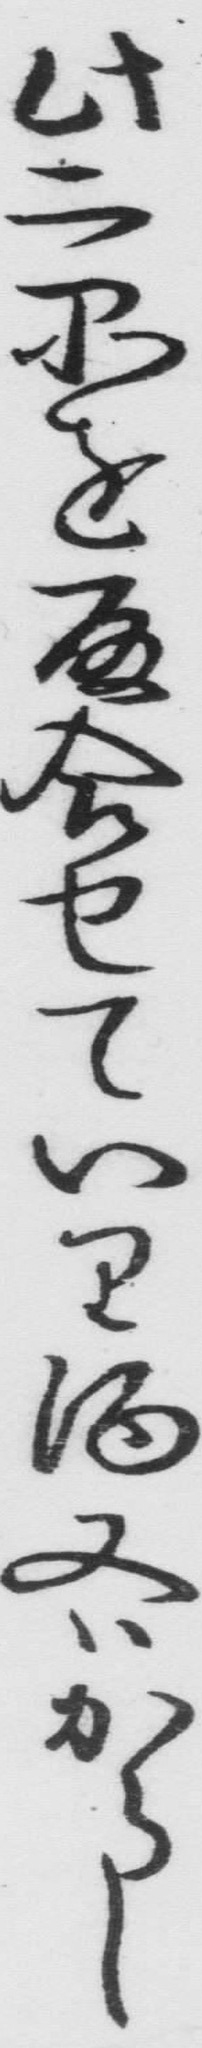此二品を取合せていり酒又はからし
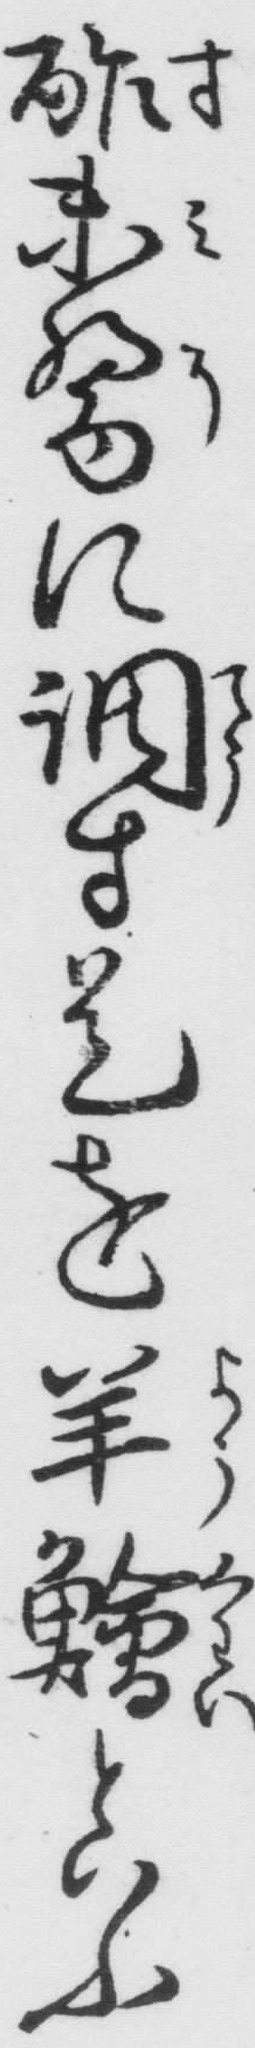酢未醤に調す是を羊鱠といふ
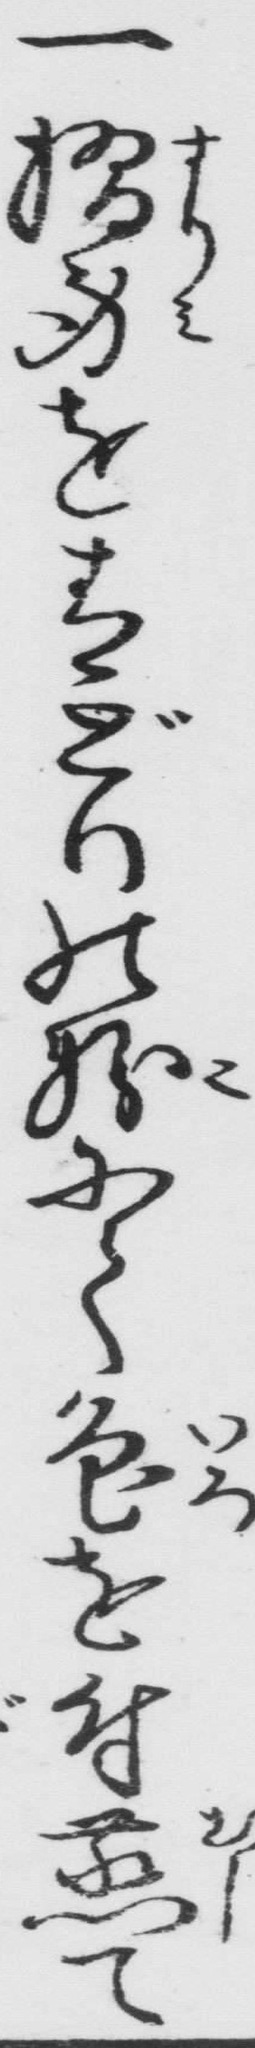一摺身を青どりの粉にて色を付蒸て
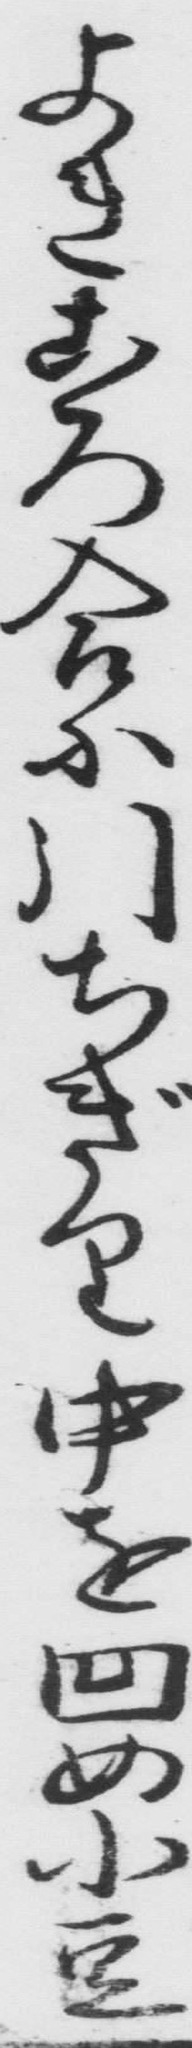よきころ合に引ちぎり中を凹め小豆
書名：海鰻百珍
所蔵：大阪府立大学学術情報センター 国文学研究資料館
